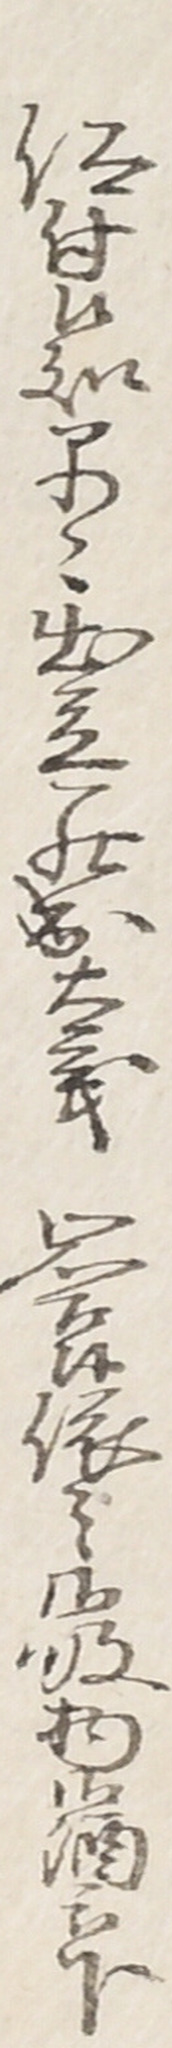仰付候処早々出立罷出太義思召候依之御吸物御酒被下
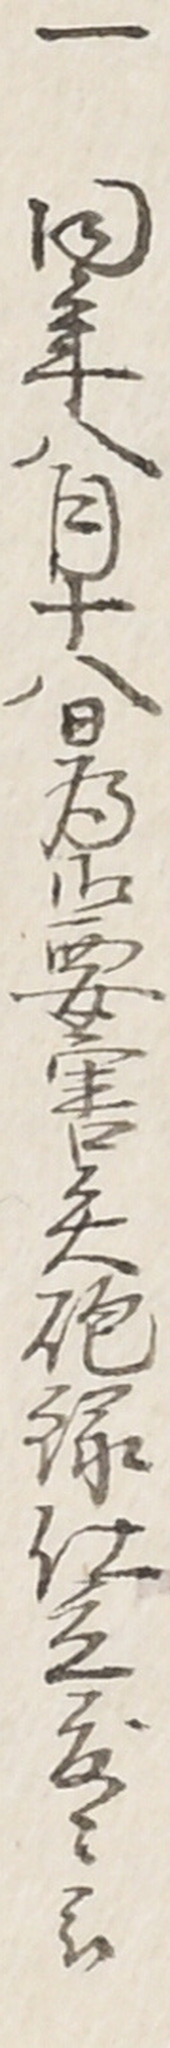一同年八月十八日為御要害矢砲録仕立度々被
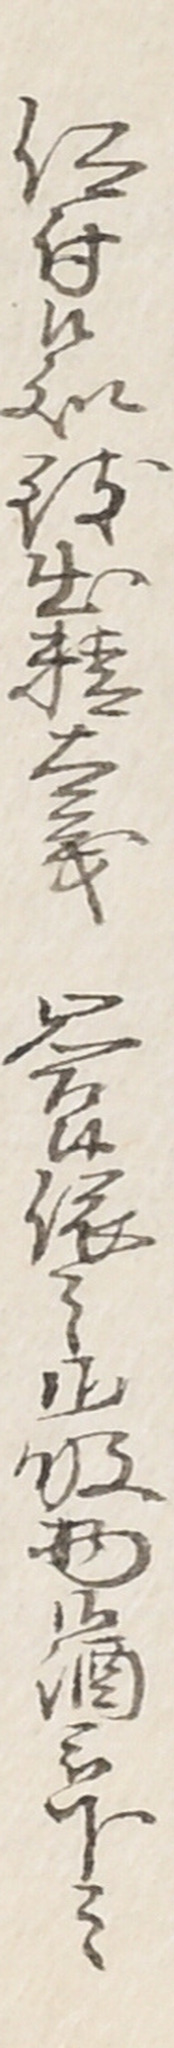仰付候処致出精太義思召候依之御吸物御酒被下之
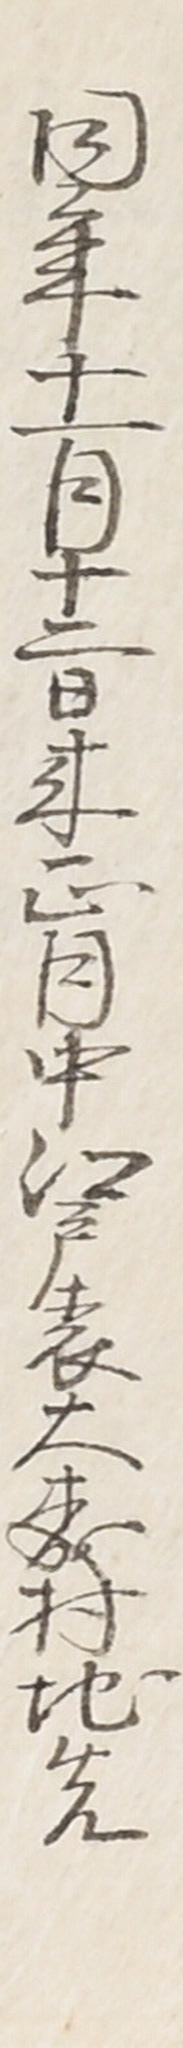一同年十一月十二日来正月中江戸表大森村地先
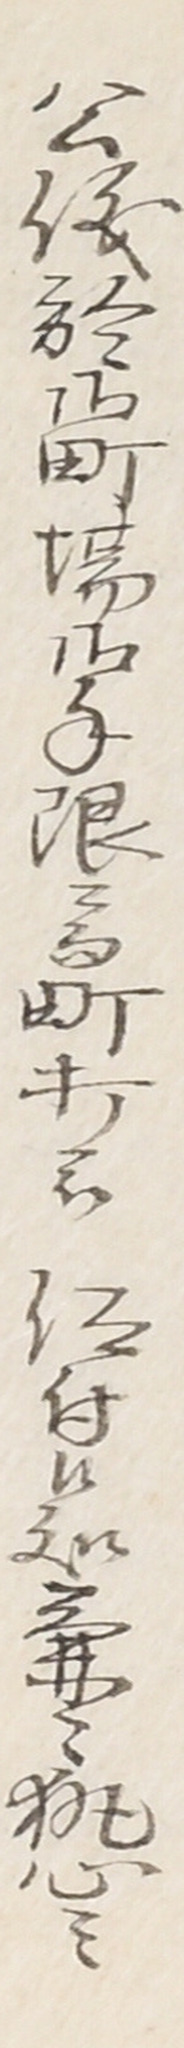公儀於御町場御手限ニ而町打被仰付候処兼々執心之
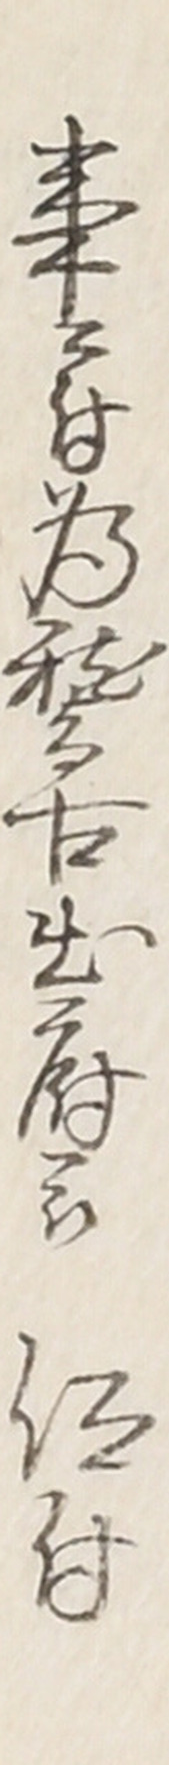事ニ付為稽古出府被仰付
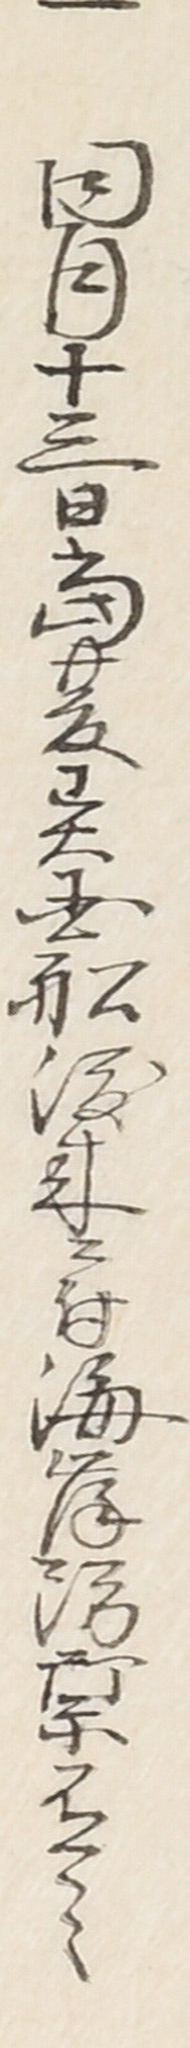一同月十三日当夏異国船渡来ニ付海岸防禦有之
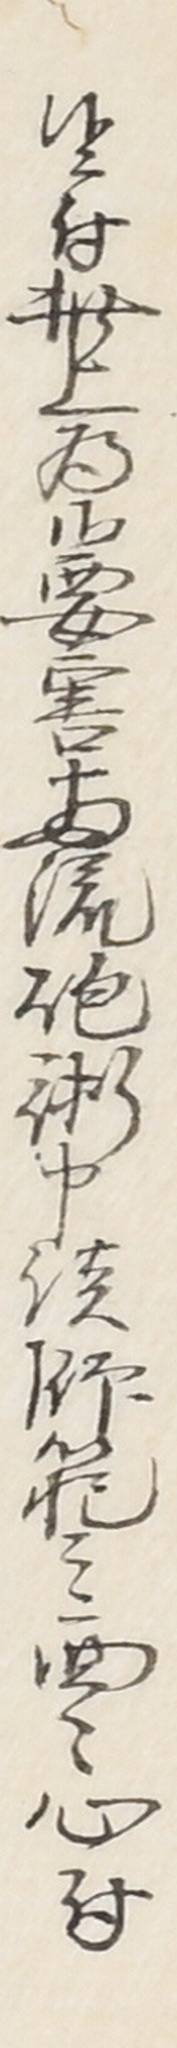候ニ付此上為御要害両流砲術申談師範之面々心付
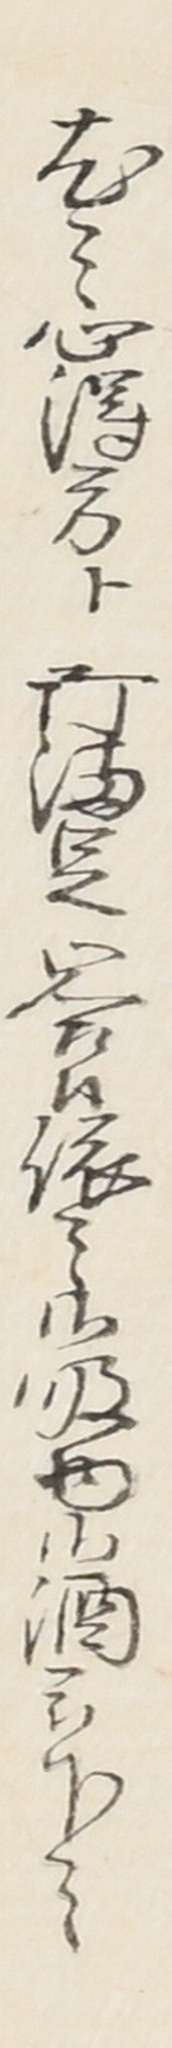尤之心得方ト御満足思召候依之御吸物御酒被下之
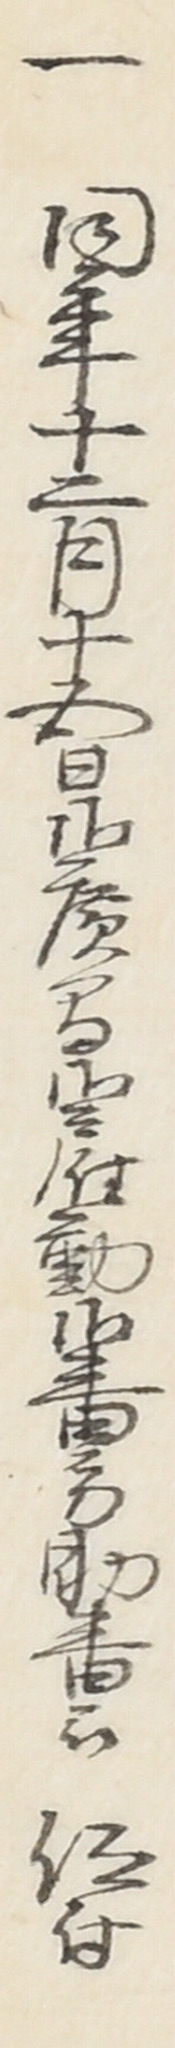一同年十二月十五日御広間御雇勤御番方助番被仰付
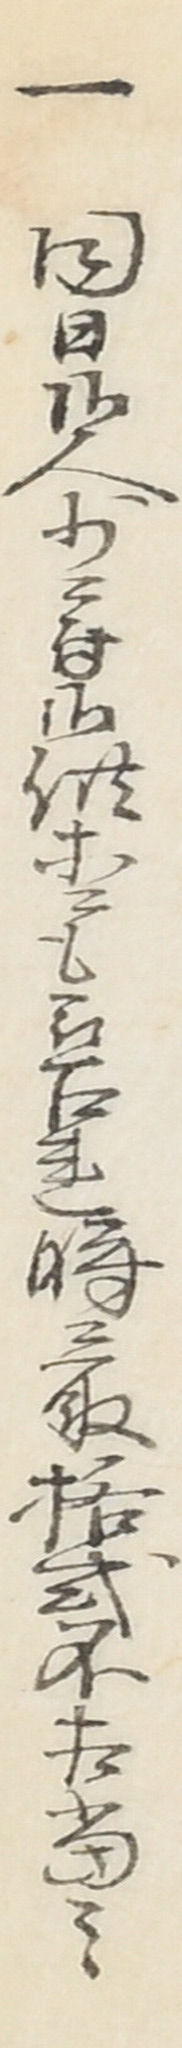一同日弐人少ニ付御供等ニも被召連時ニ取格式不相当之
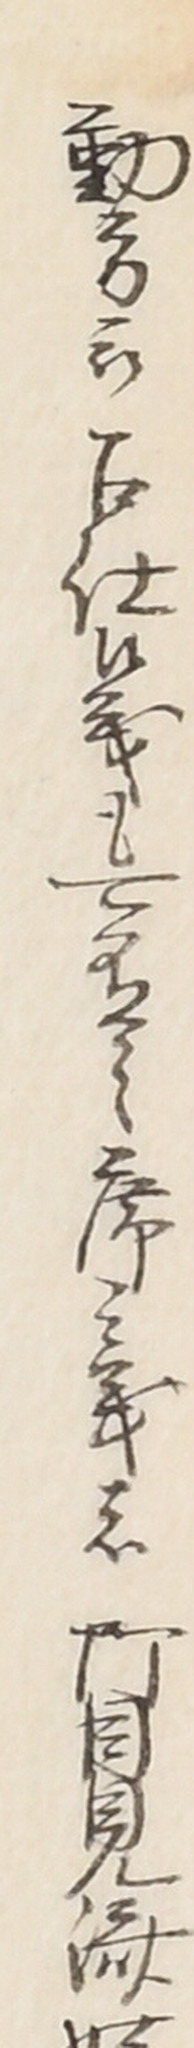勤方被召仕候義も可有之席之義は御目見済嫡子
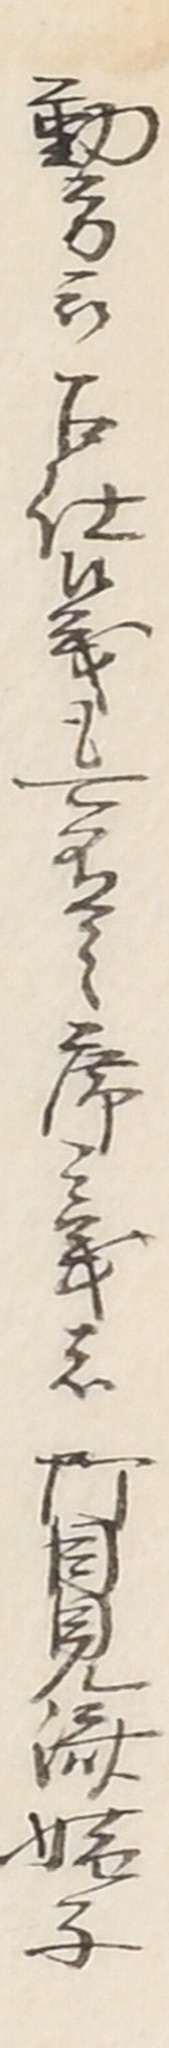勤方被召仕候義も可有之席之義は御目見済嫡子
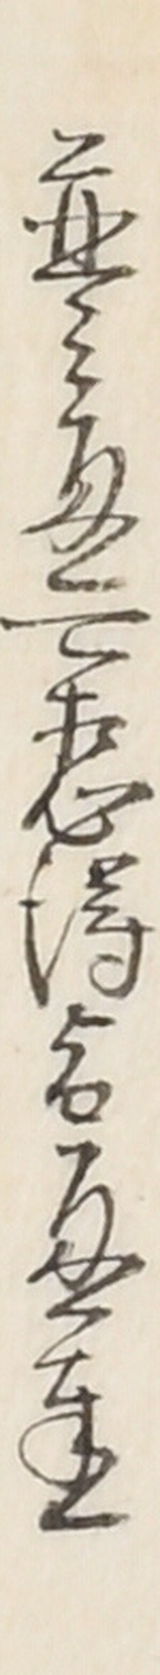並之通可相心得旨通達
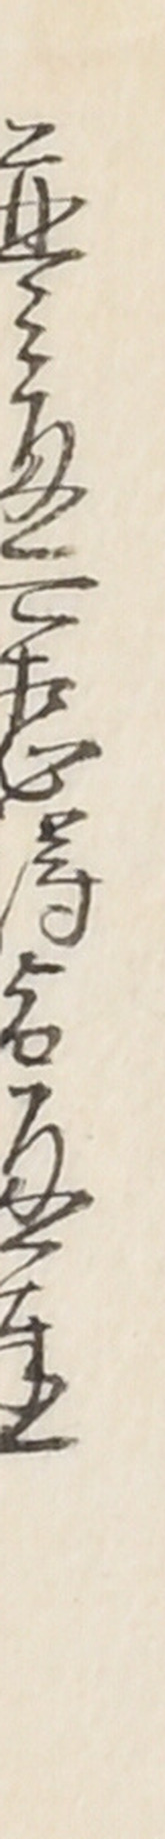並之通可相心得旨通達
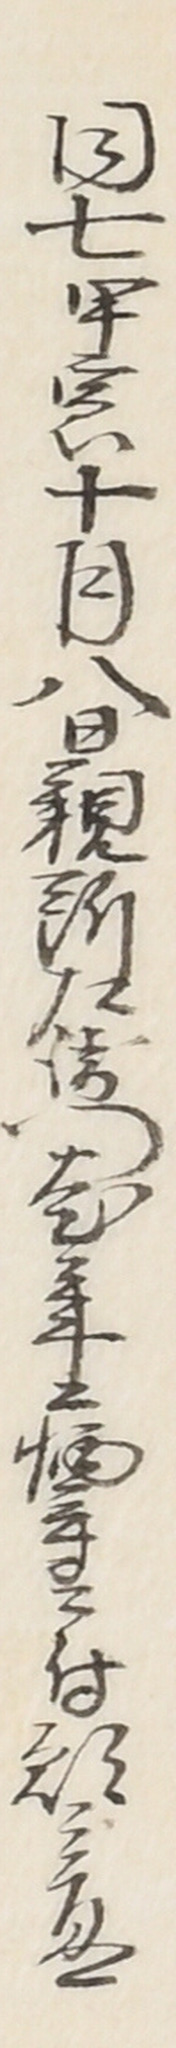一同七甲寅十月八日親所仁左衛門老年病気ニ付願之通
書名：給人諸士勤仕録（七）
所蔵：伊那市立高遠町図書館・合同会社AMANE
